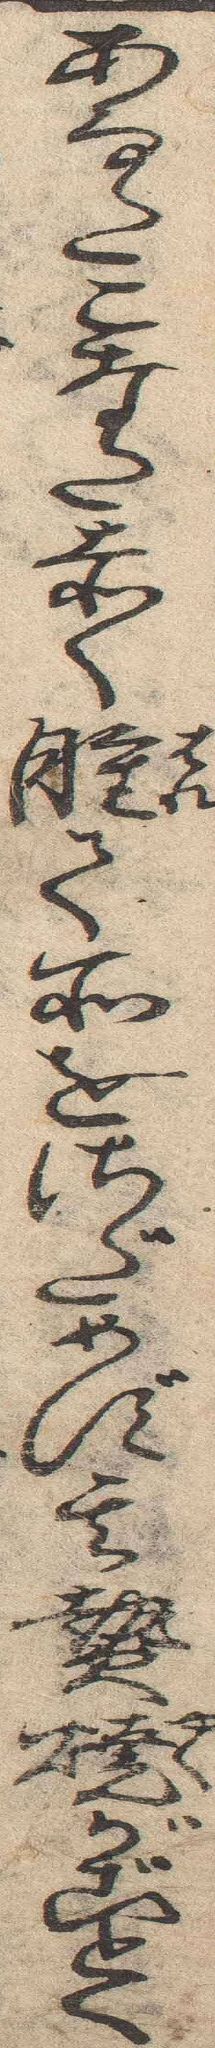あなたこなた赤く腫て所をさだめず其熱焼がごとく
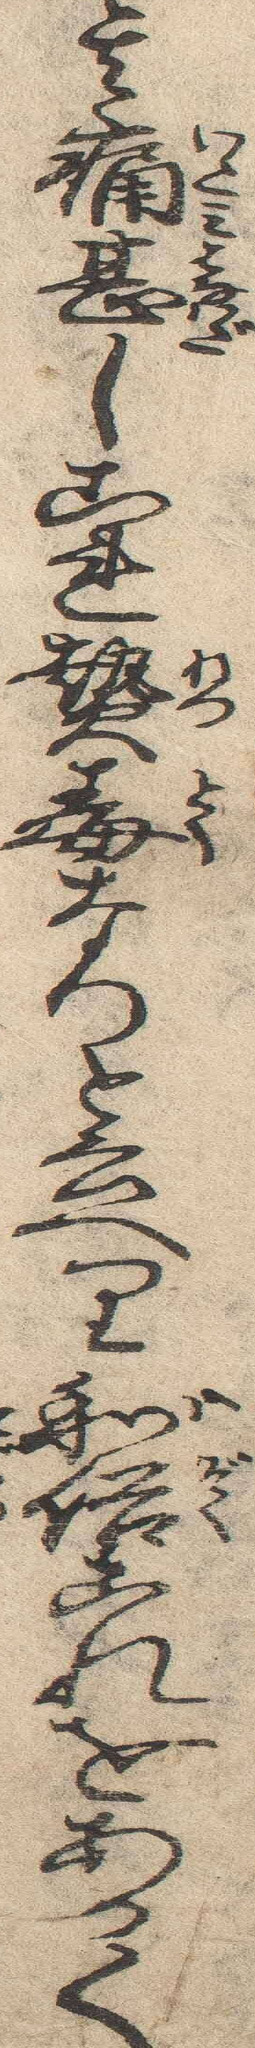其痛甚しこれ熱毒なりと云へり和俗これをあかく
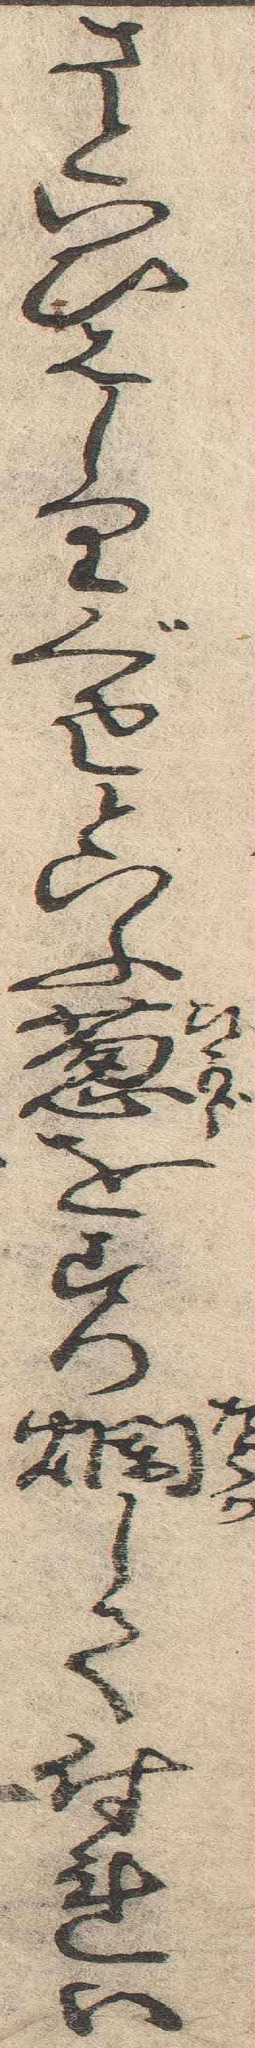さといひはしりぐさといふ葱をすり爛して付れは
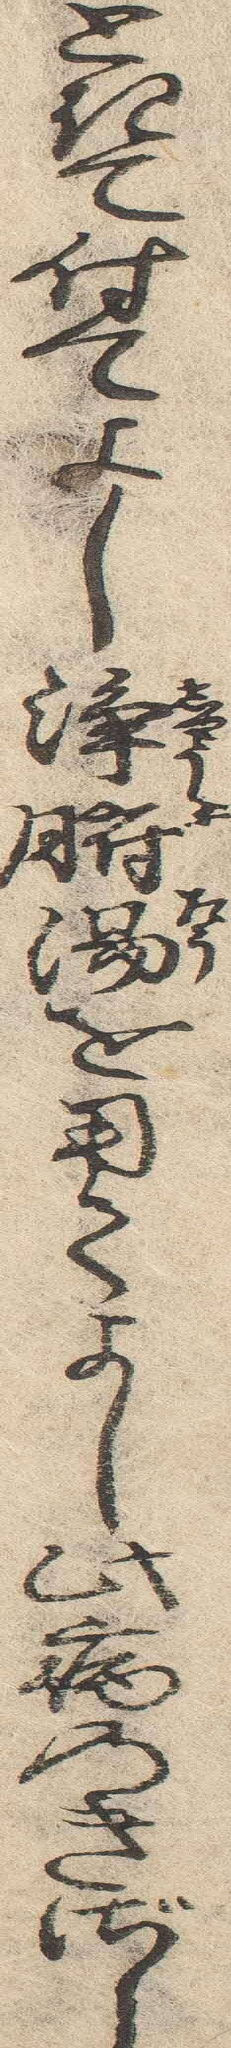ときて付てよし浄腑湯を用てよし此病のきざし
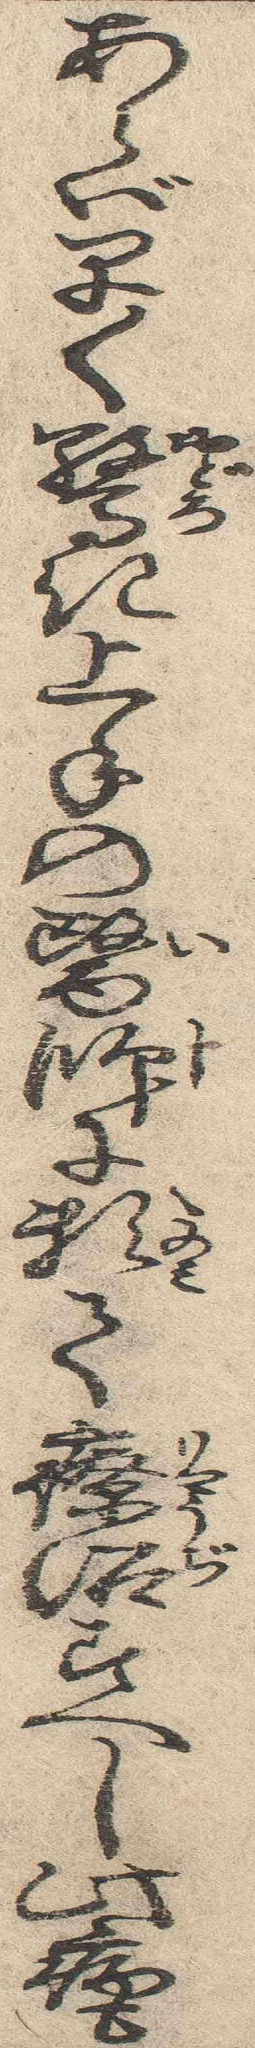あらば早く驚き上手の医師に頼て療治すへし此病も
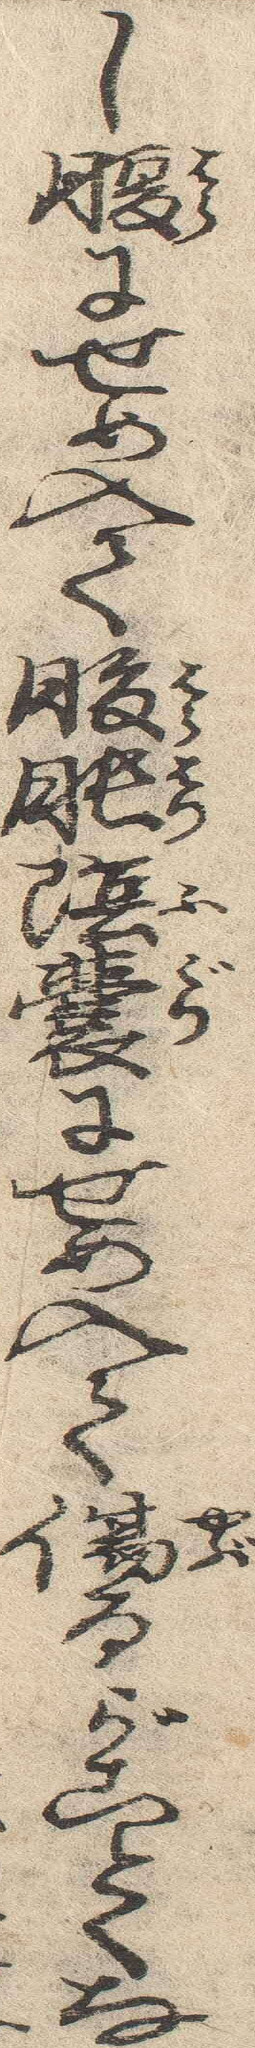し腹にせめ入て腹脹陰嚢にせめ入て傷るゝがことくな
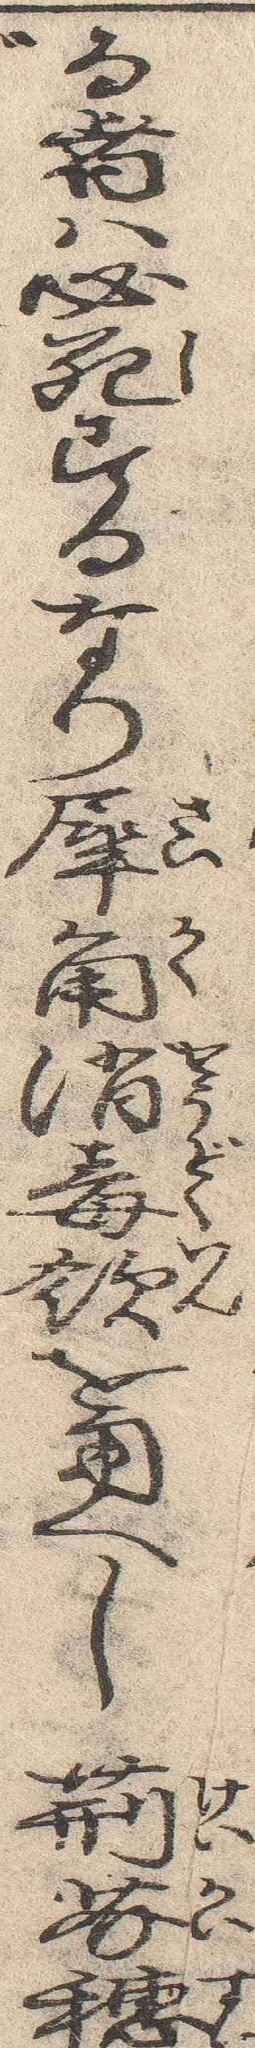る者は必死するなり犀角消毒飲を用へし荊芥穂
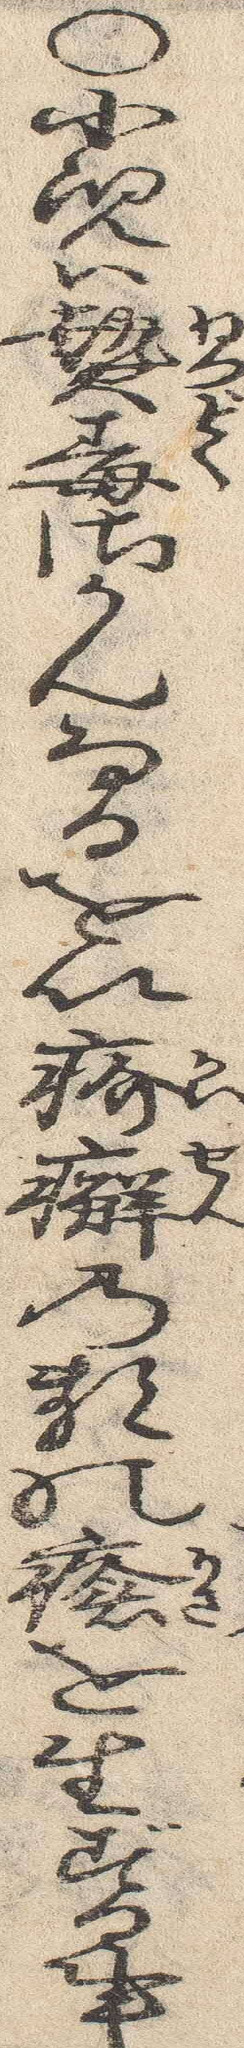○小児は熱毒さかんなるを以疥癬の類の瘡を生ずる事
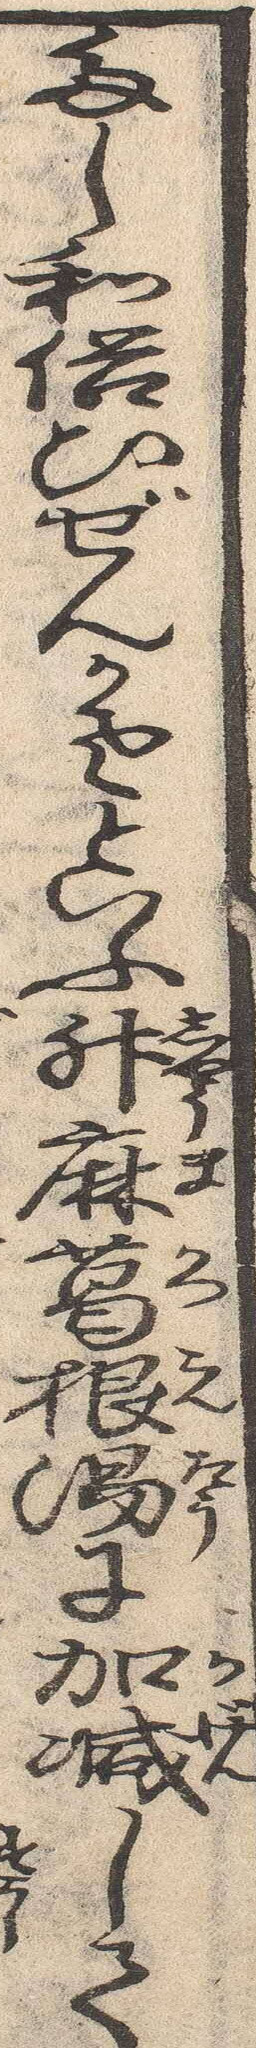多し和俗ひぜんかさといふ升麻葛根湯に加減して
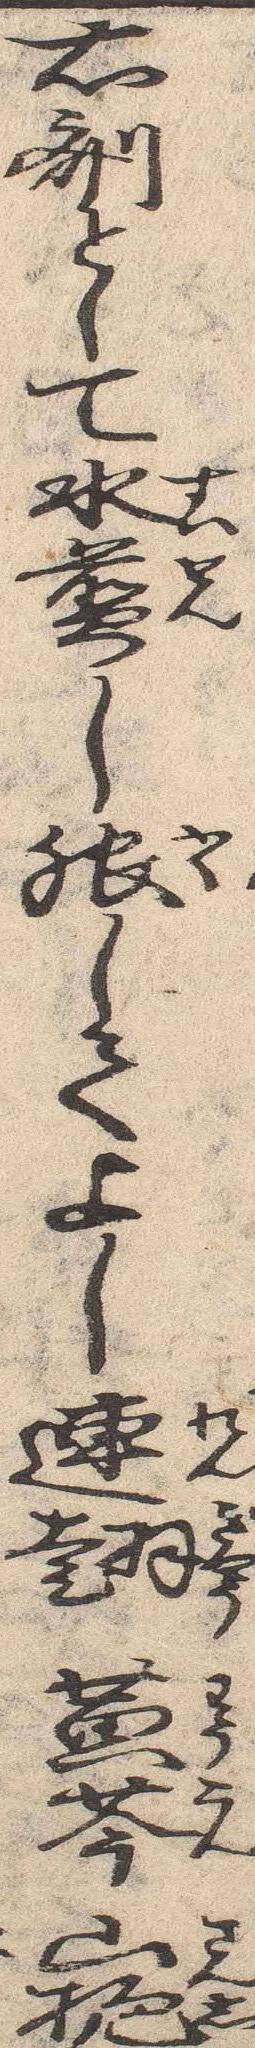右剤として水煎し服してよし連翹黄芩山梔
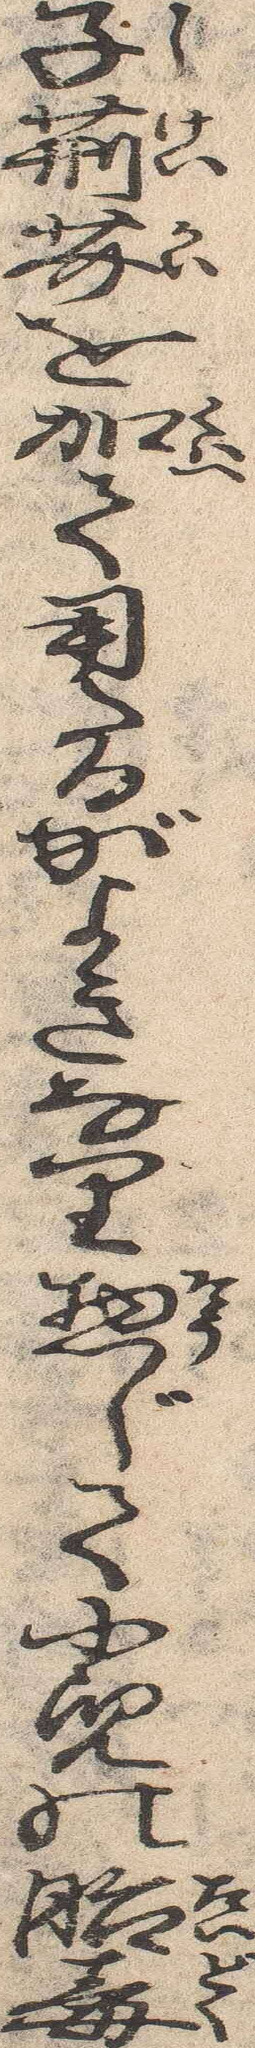子荊芥を加て用たるがよきなり総じて小児の胎毒
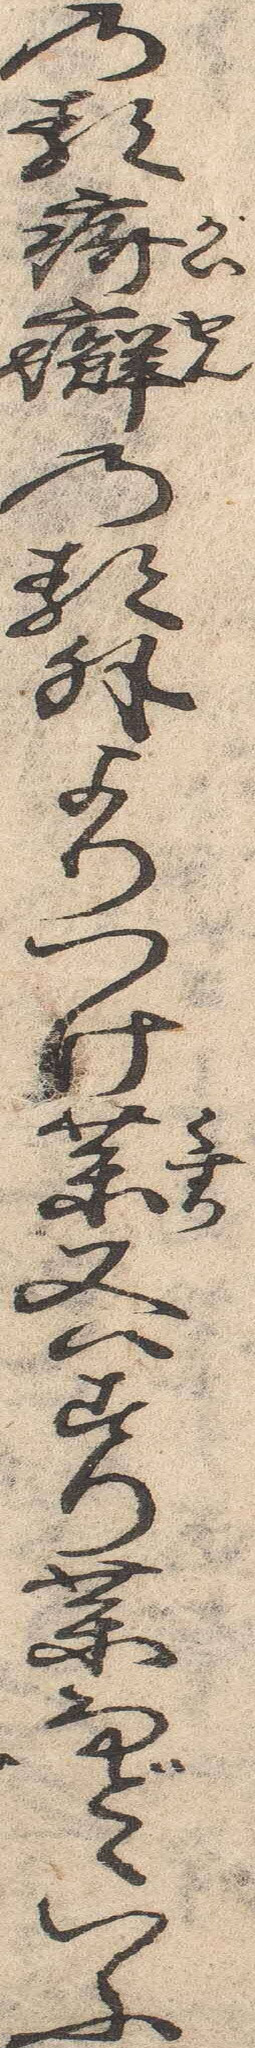の類疥癬の類外よりつけ薬又はすり薬などゝいふ
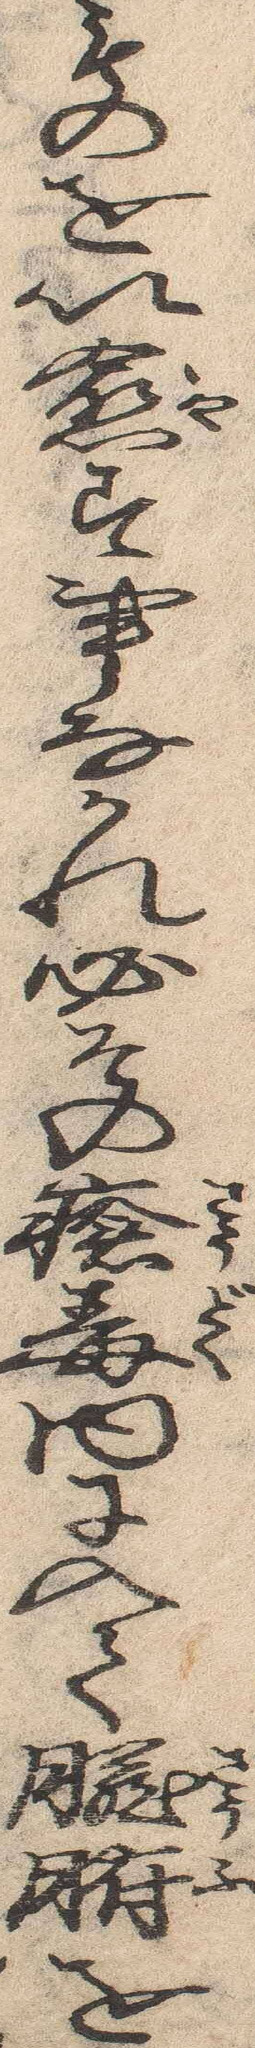ものを以愈す事なかれ必その瘡毒内に入て臓腑を
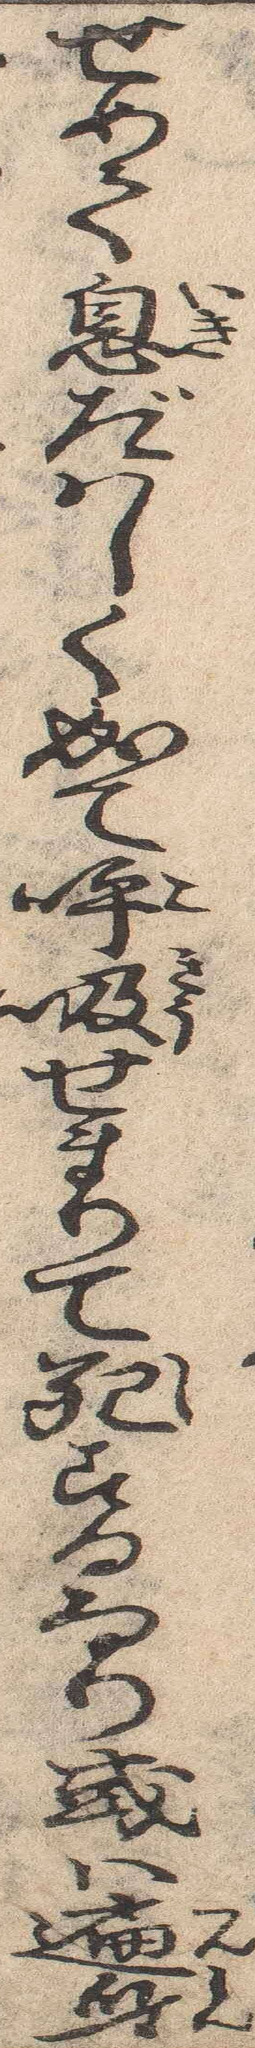せめて息だはしく成て呼吸せまりて死するなり或は遍身
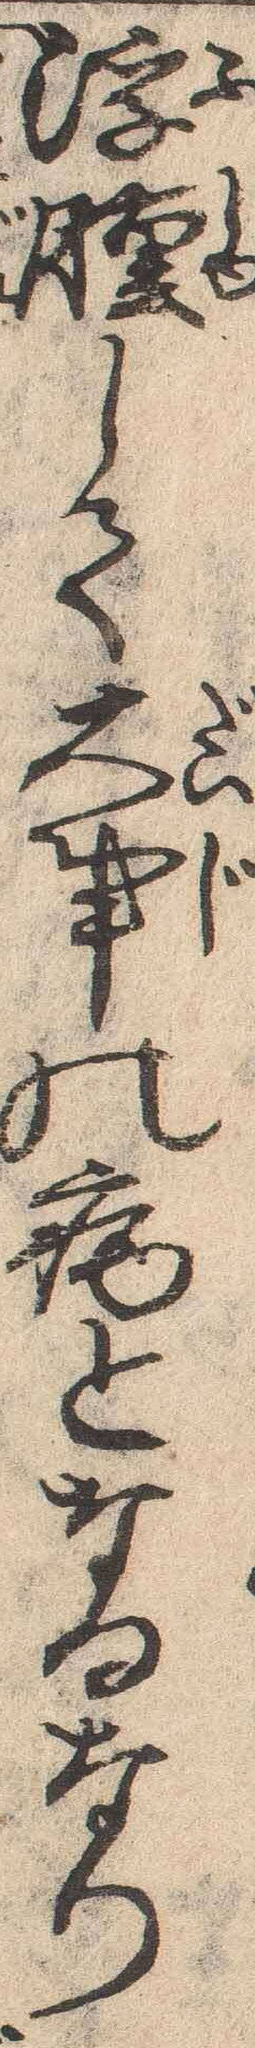浮腫して大事の病となるなり
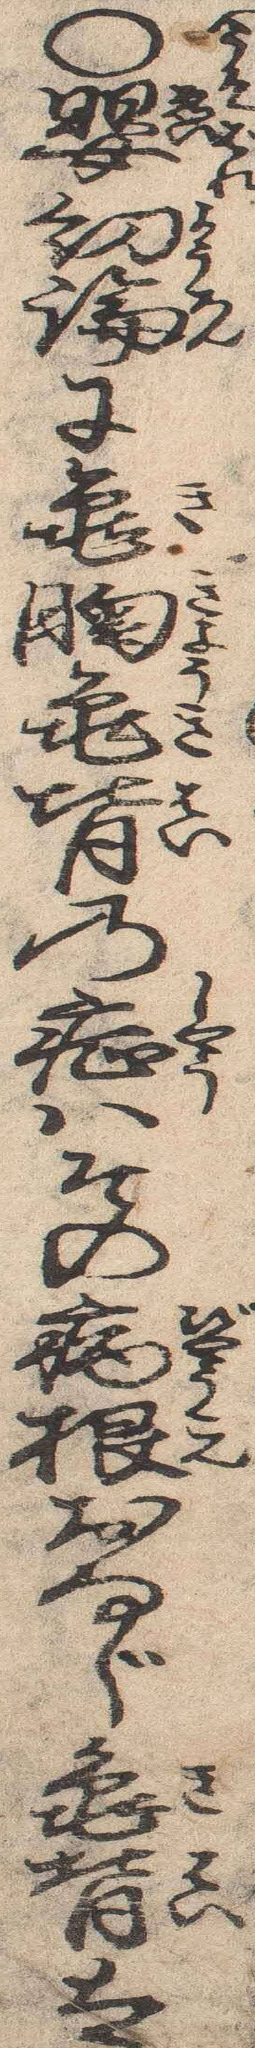○嬰幼論に亀胸亀背の症はその病根おなじ亀背は
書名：小児必用養育草
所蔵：東京学芸大学附属図書館 国文学研究資料館
